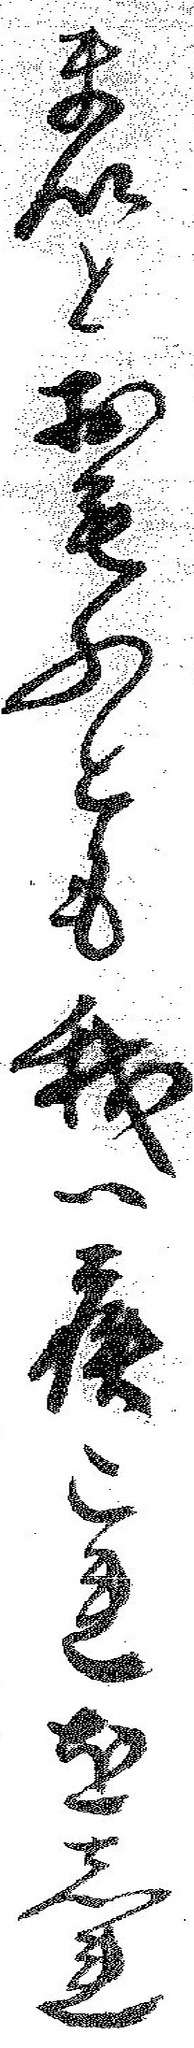まいとおもふとも我は疾これをしれ
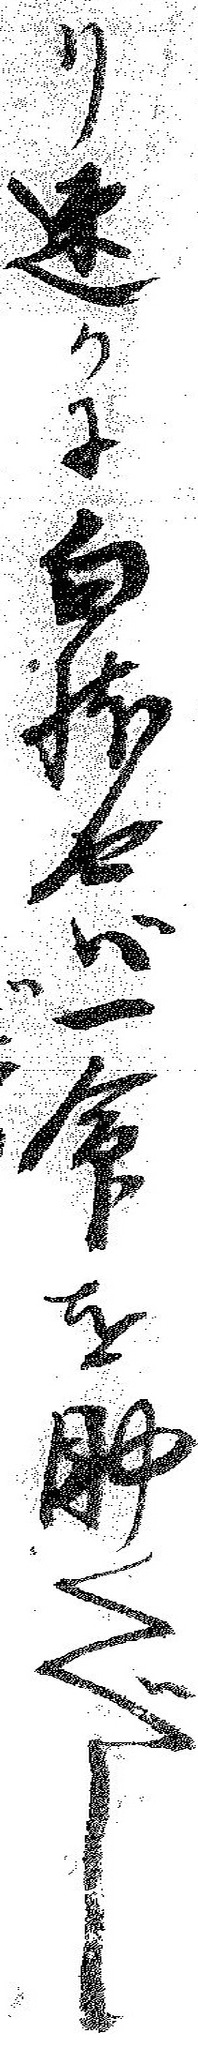り速かに白状せば一命を助くべし
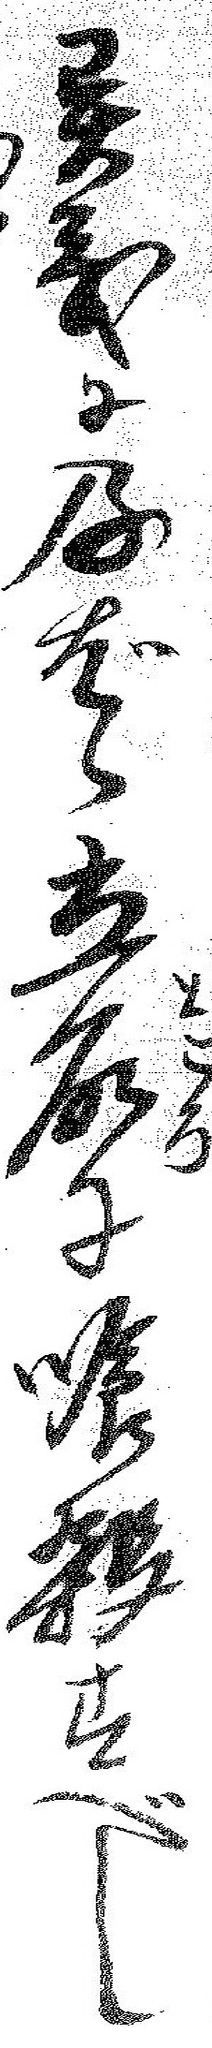異義に及ばゝ立所に喰殺すべし
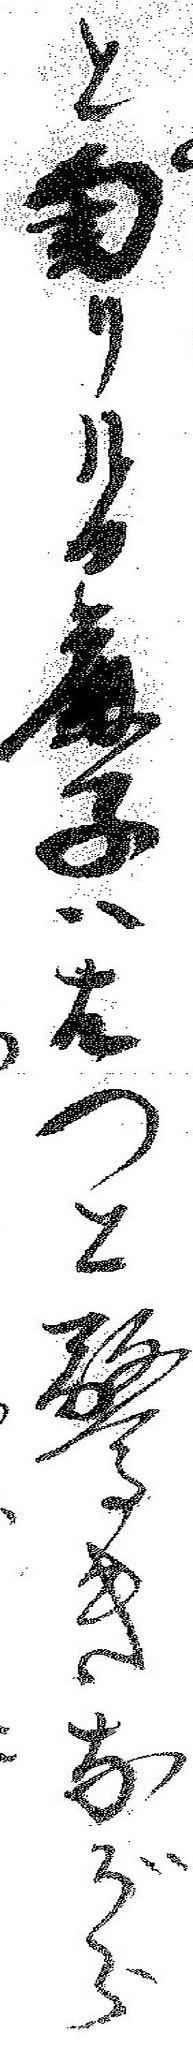と訇りける鹿子ははつと驚きながら
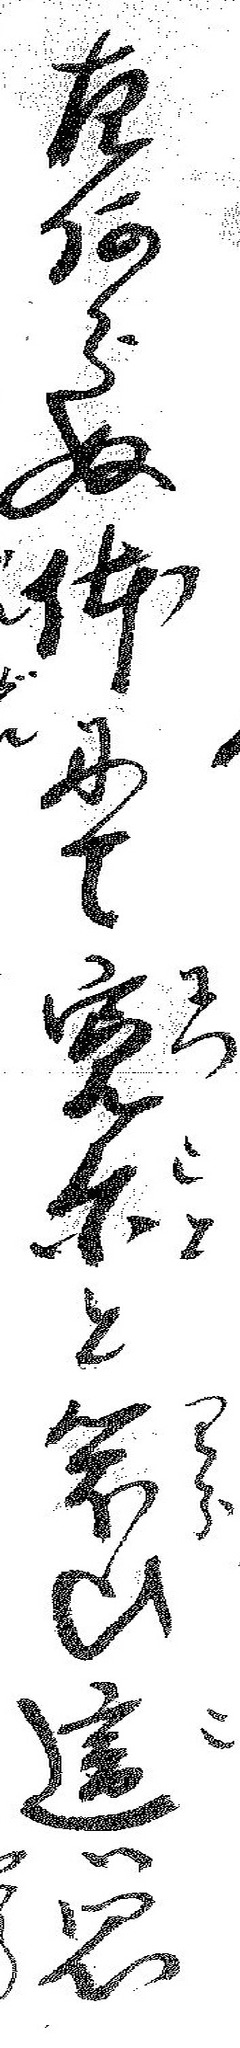左あらぬ体にて莞爾と笑ひは思
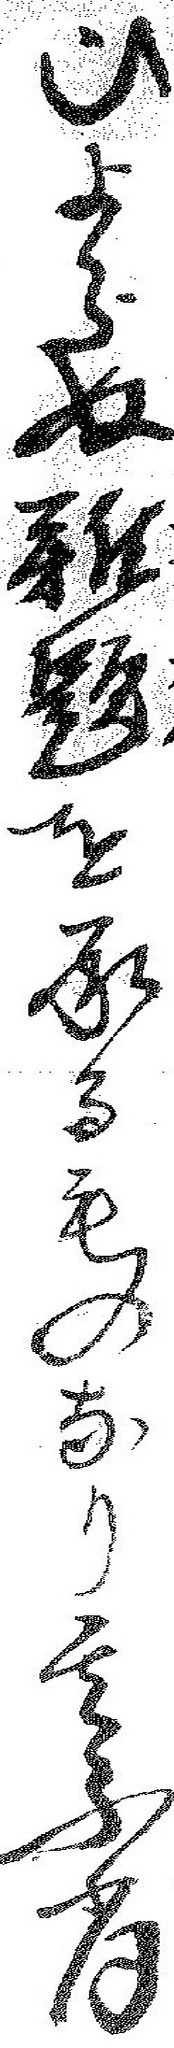ひよらぬ難題を承るものなり其不肖
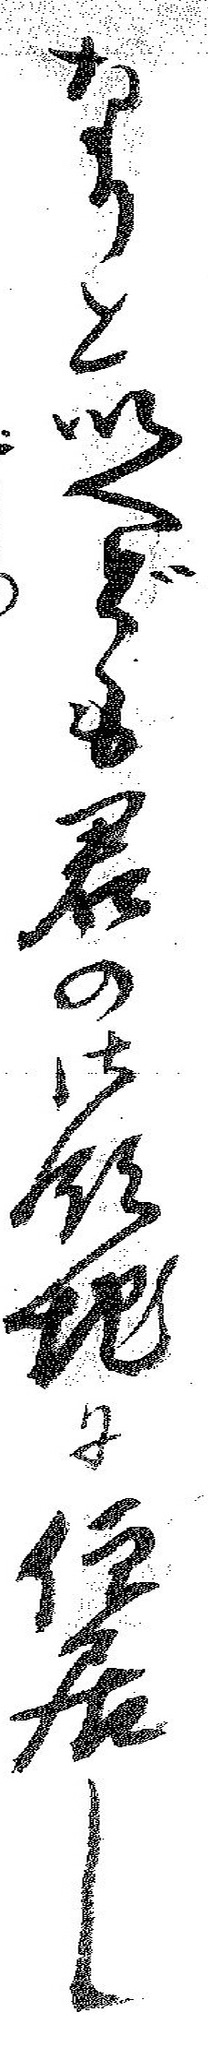なりといへども君の御領地に住居し
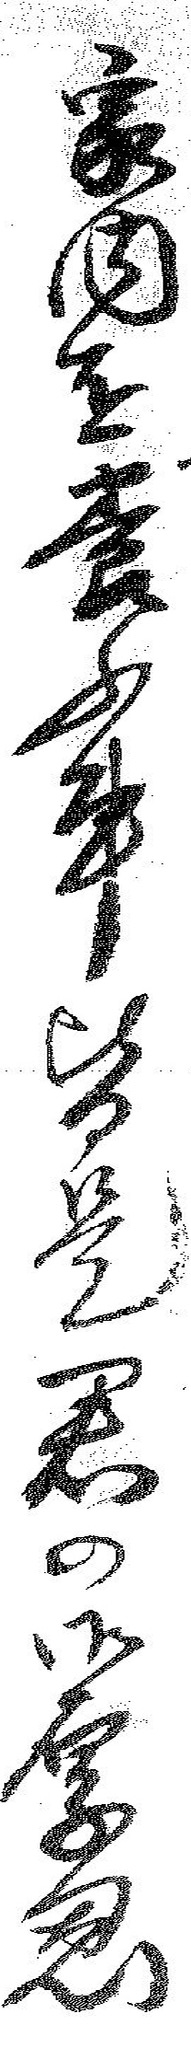家内を養ふ事皆是君の御厚恩
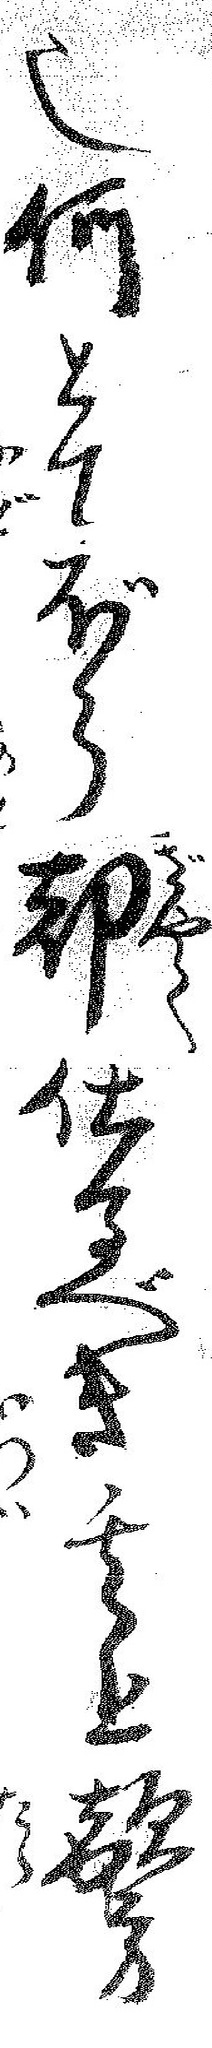也何とてぼう却仕るべき其上敵方
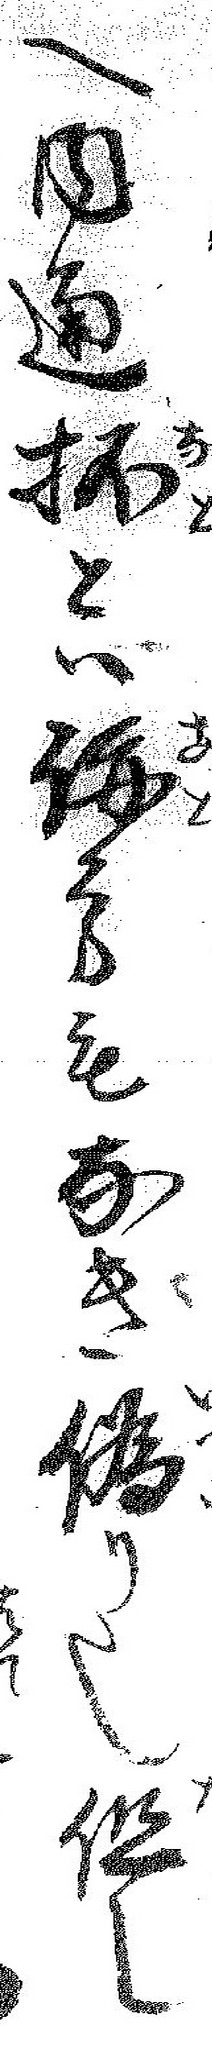へ内通等とは跡方もなき偽り也但し
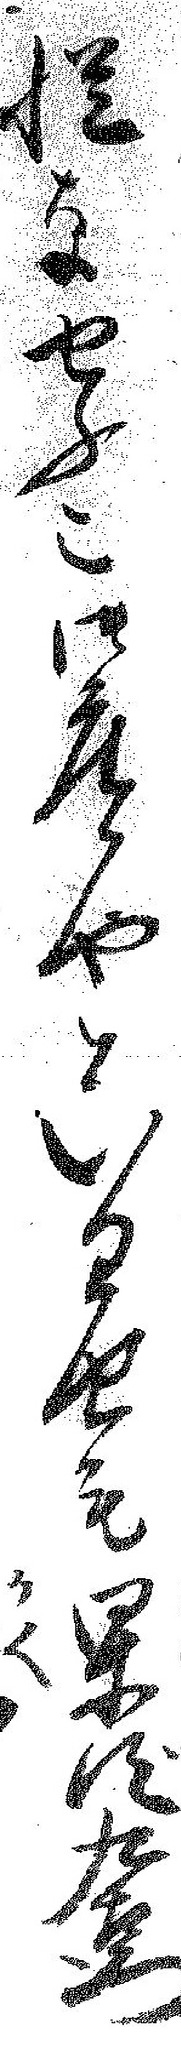慥なせふこ御座候やといわせも果ず九左衛門
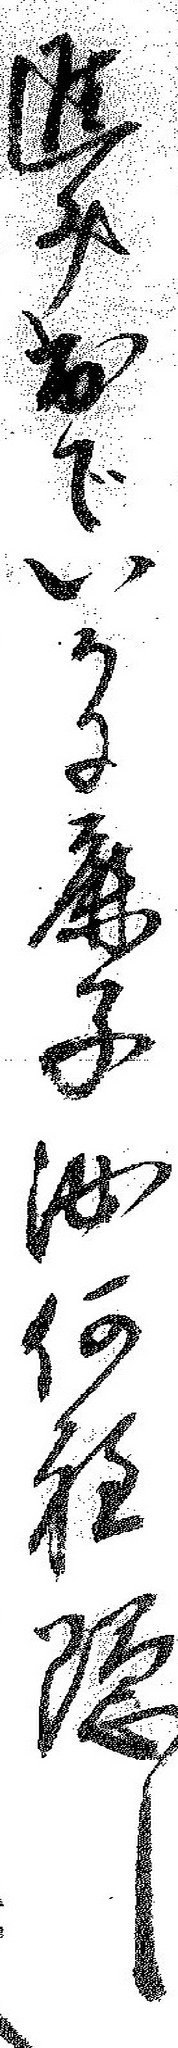進み出でいかに鹿子汝何程隠し
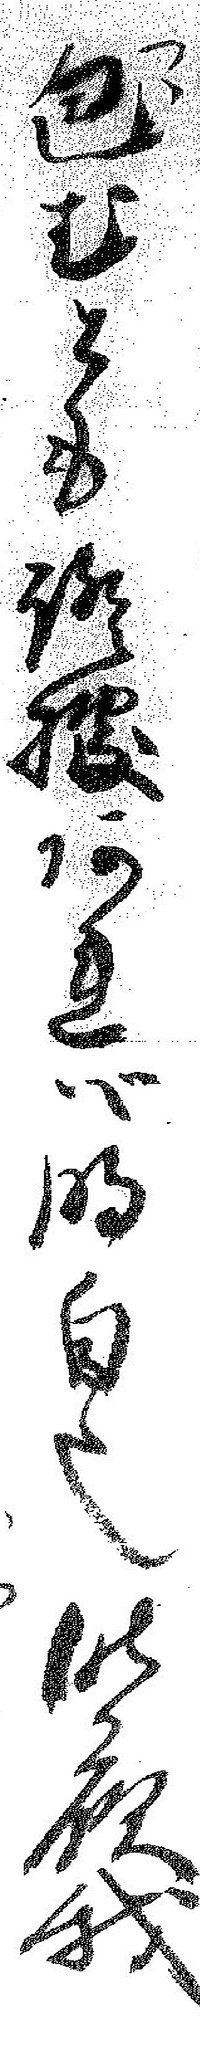包むとも証拠あれば明白也昨日夜我
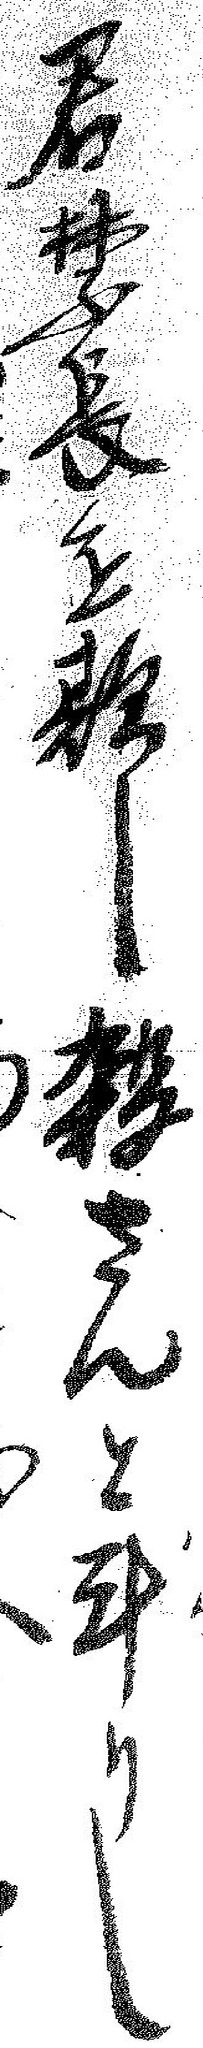君禁長を欺し殺さんと斗りし
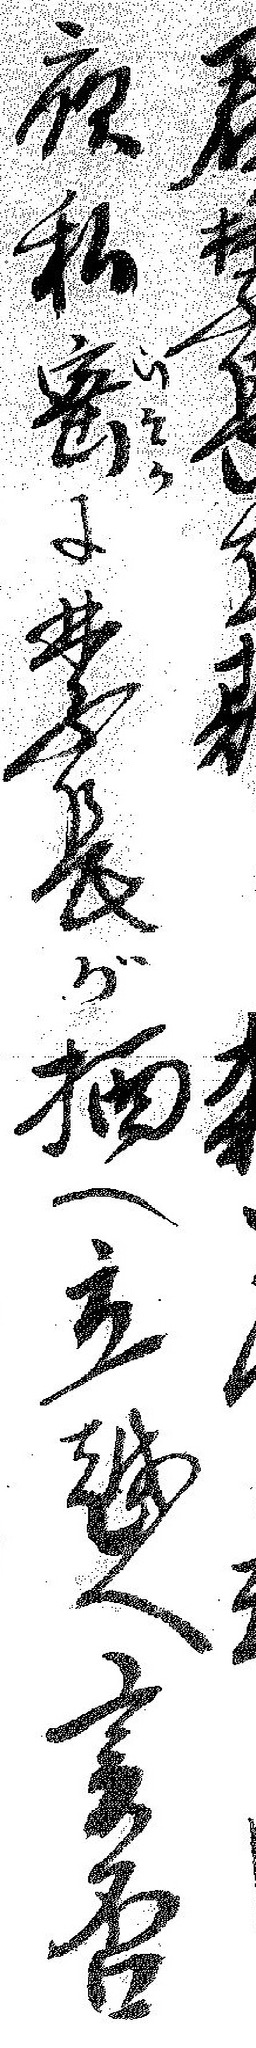夜私密に禁長が栖ほ立越へ実否
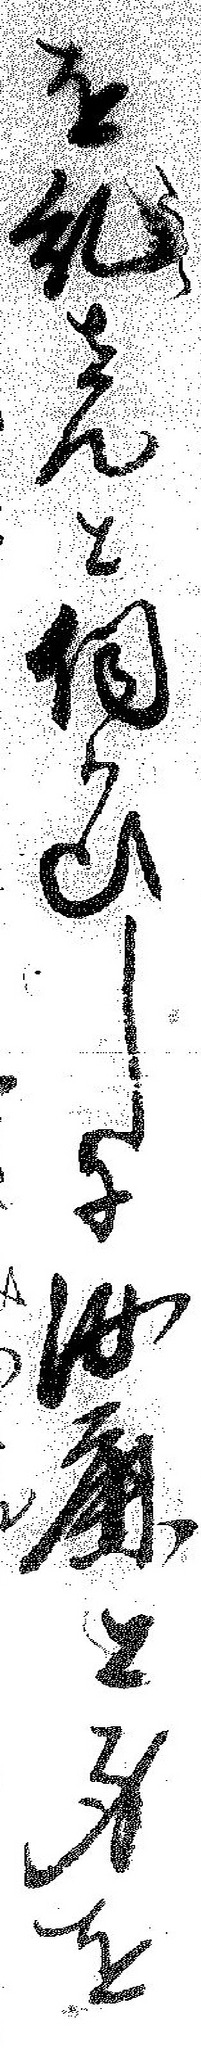を糺さんと伺かひしに汝鹿と身を
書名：近頃古狸珍説　礼義智信
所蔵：徳島県立図書館
